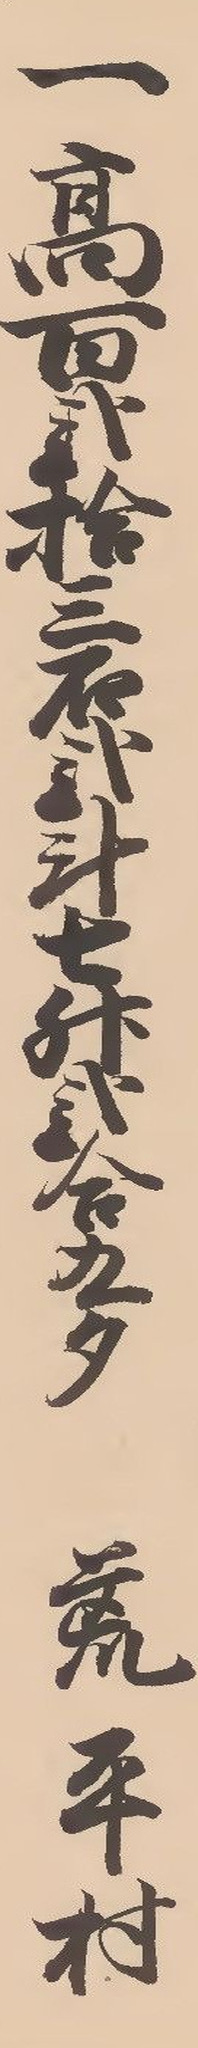一高百弐拾三石弐斗七升弐合九勺荒平村
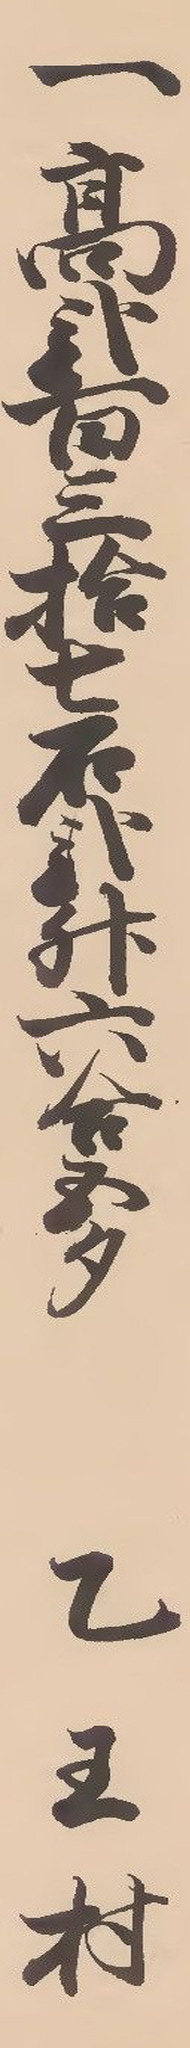一高弐百三拾七石弐升六合五勺乙王村
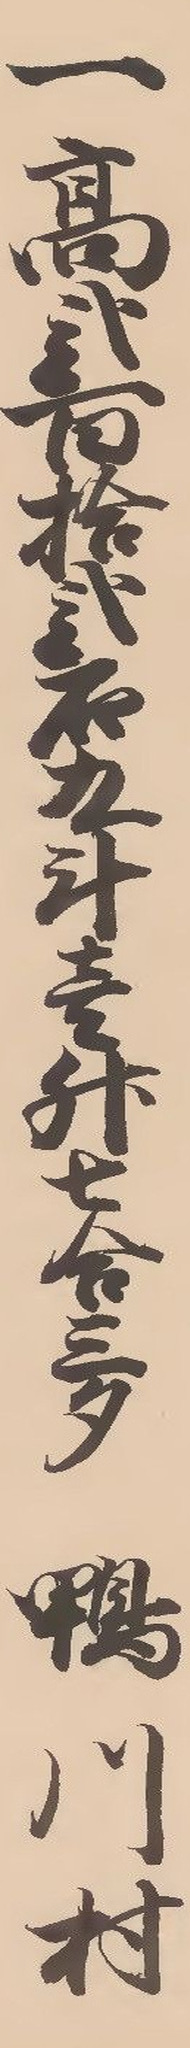一高弐百拾弐石九斗壱升七合三勺鴨川村
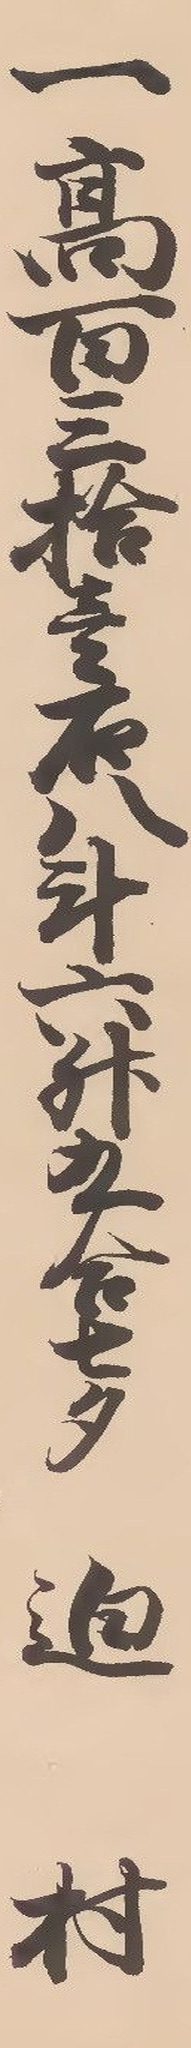一高百三拾壱石八斗六升九合七勺迫村
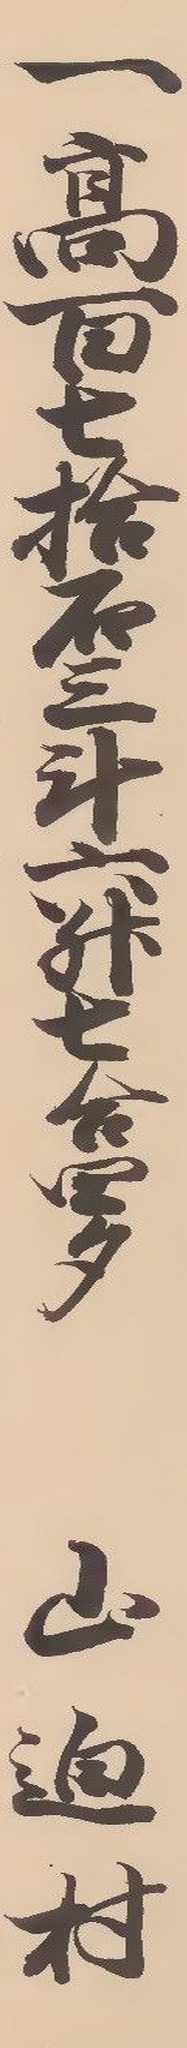一高百七拾石三斗六升七合四勺山迫村
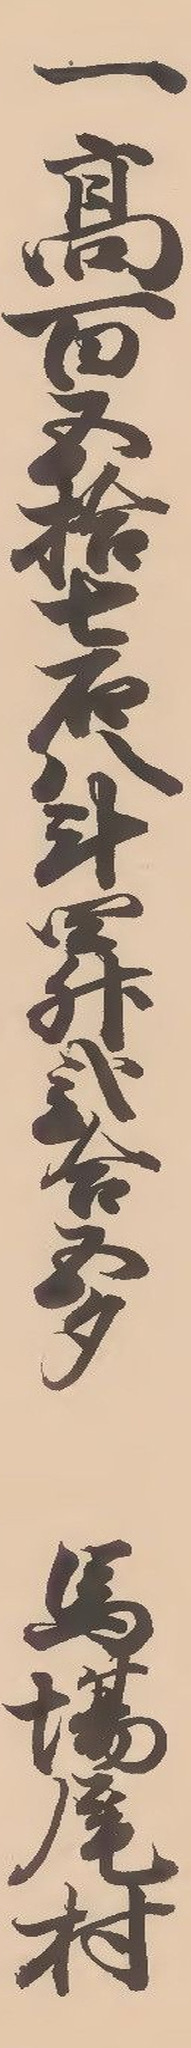一高百五拾七石八斗四升弐合五勺馬場尾村
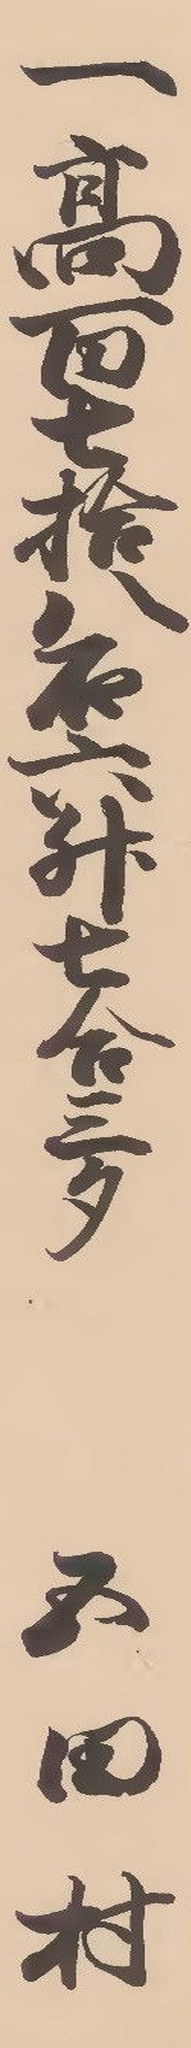一高百七拾八石六升七合三勺五田村
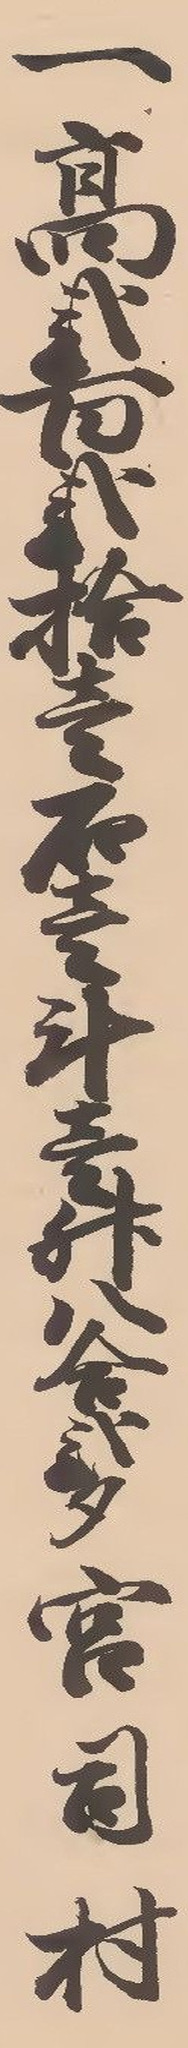一高弐百弐拾壱石壱斗壱升八合弐勺宮司村

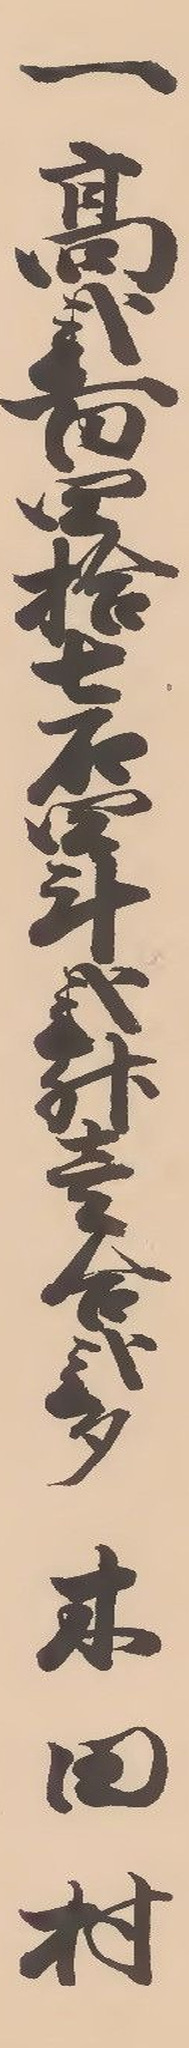一高弐百四拾七石四斗弐升壱合弐勺木田村
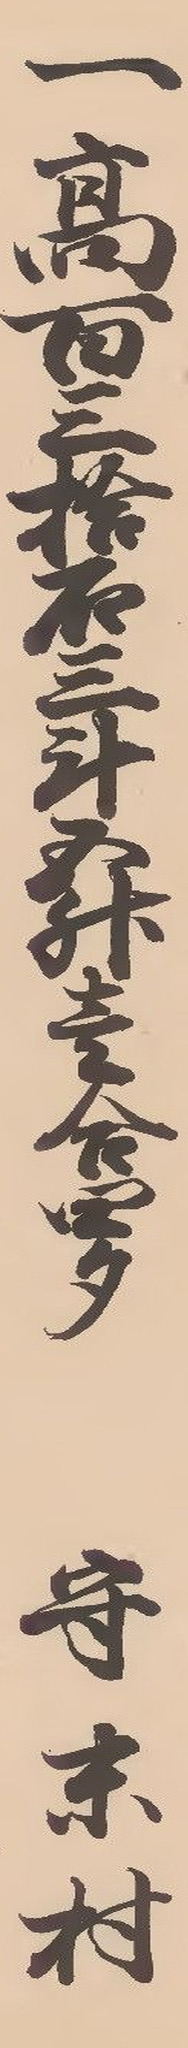一高百三拾石三斗五升壱合四勺守末村
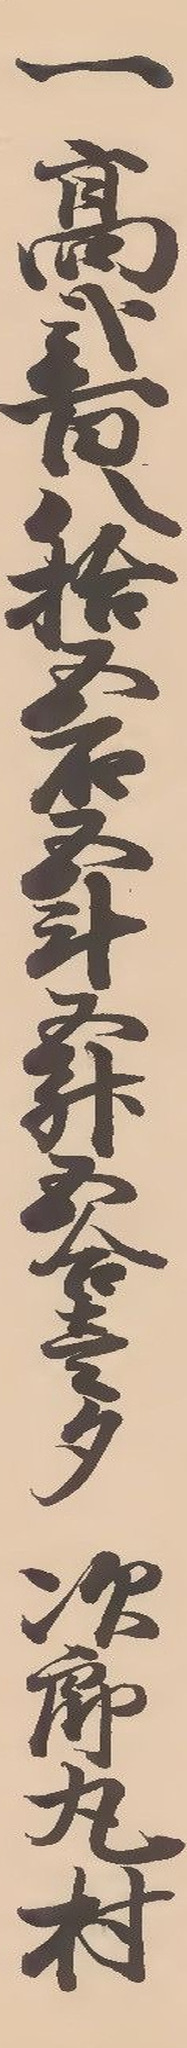一高弐百八拾五石五斗五升五合壱勺次郎丸村
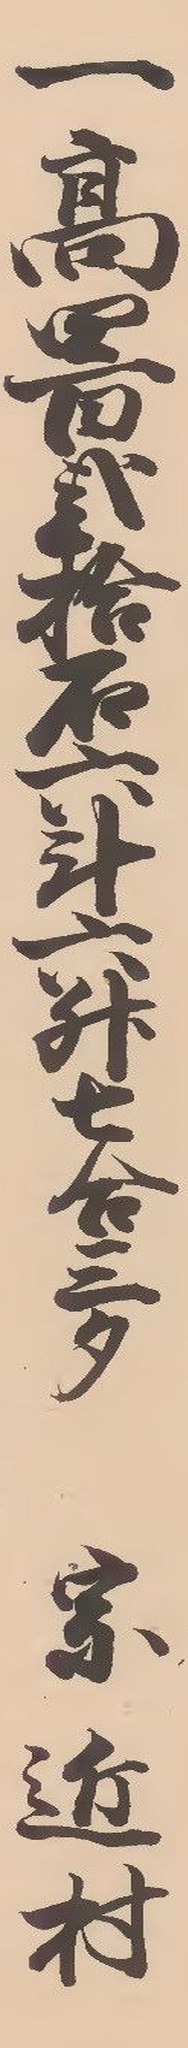一高四百弐拾石六斗六升七合三勺宗近村
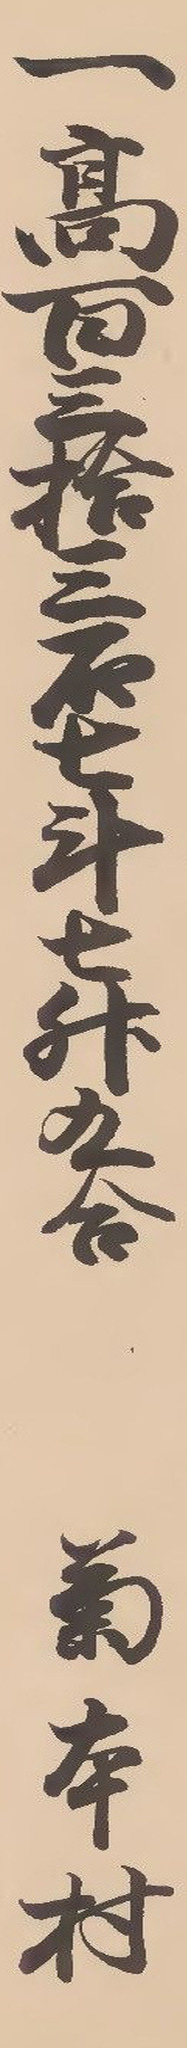一高百三拾三石七斗七升九合菊本村
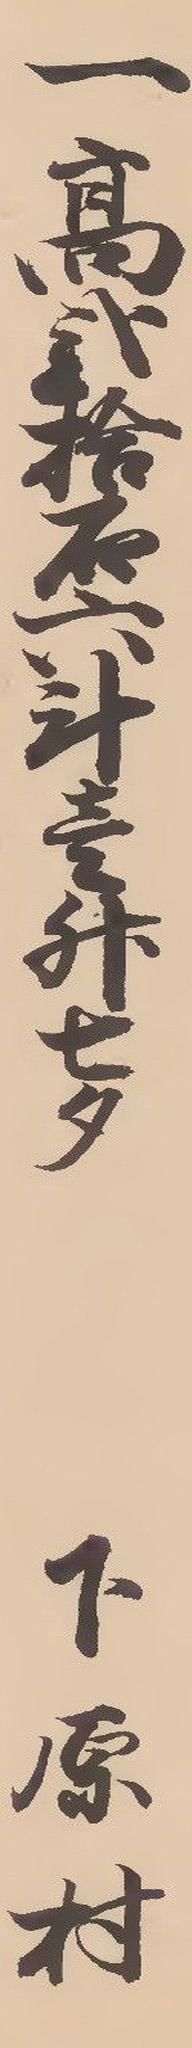一高弐拾石六斗壱升七勺下原村
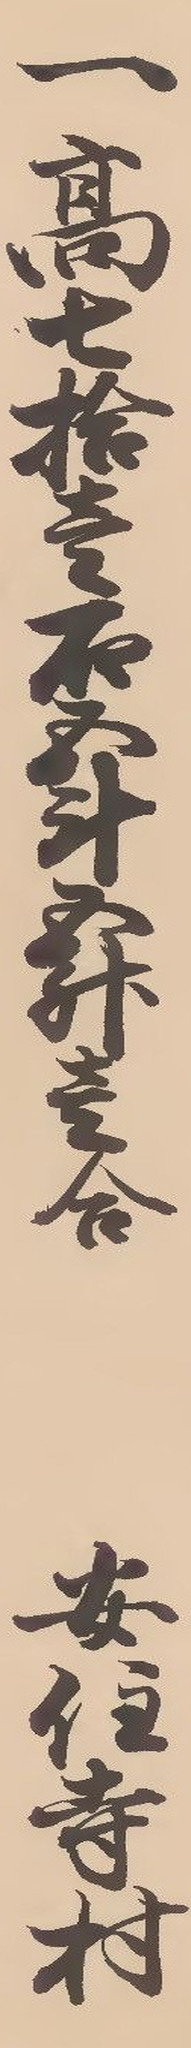一高七拾壱石五斗五升壱合安住寺村
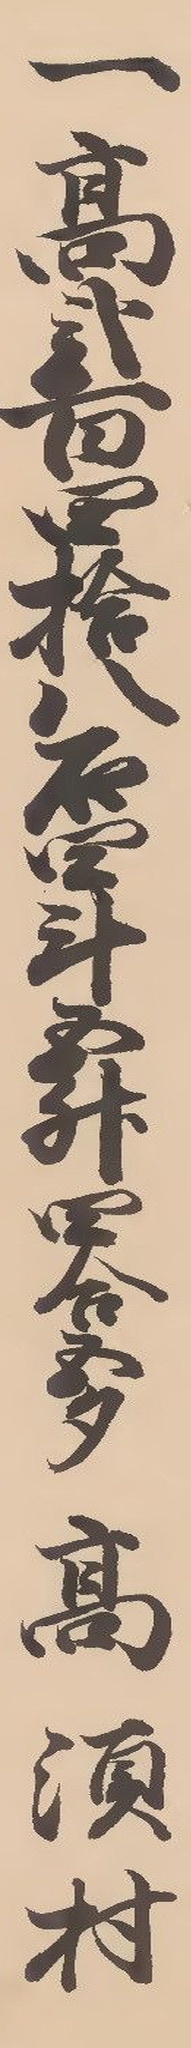一高弐百四拾八石四斗五升四合五勺高須村
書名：豊後国郷帳
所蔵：国立公文書館 National Archives of Japan
